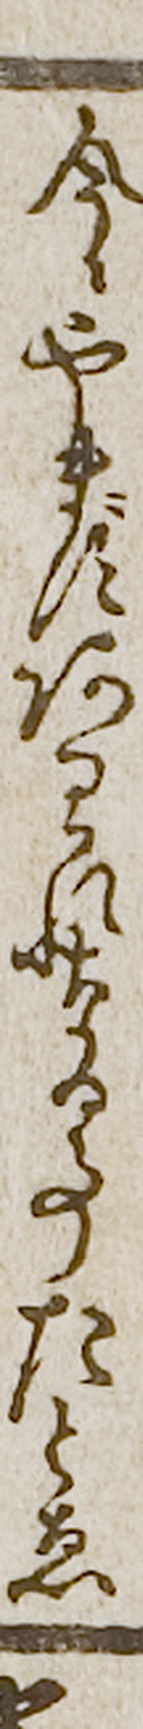今にやまずあわれなる事たとゑ
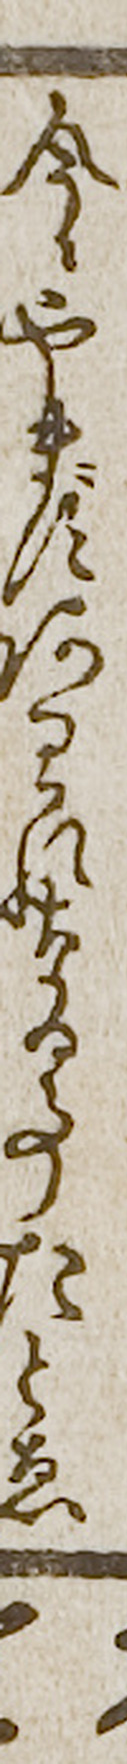今にやまずあわれなる事たとゑ
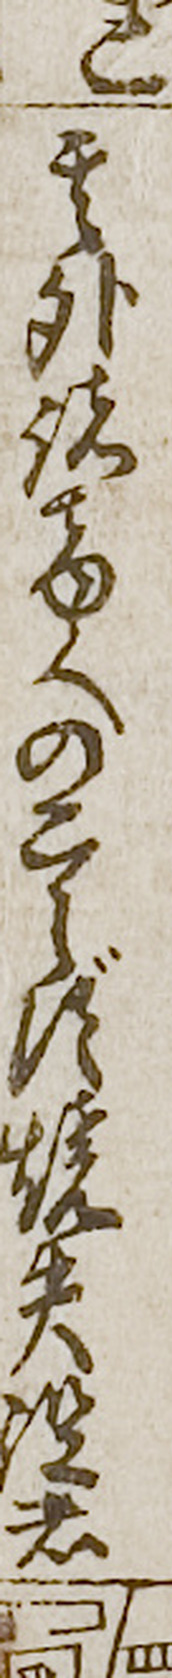其外諸商人のこらず焼失役者
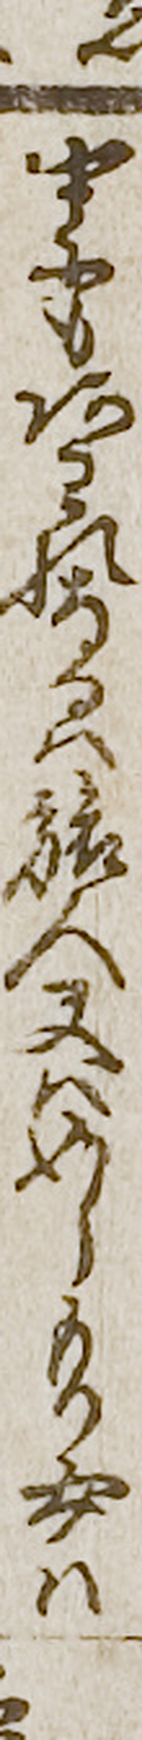中にもあわれなるは旅人又はめしもり女は
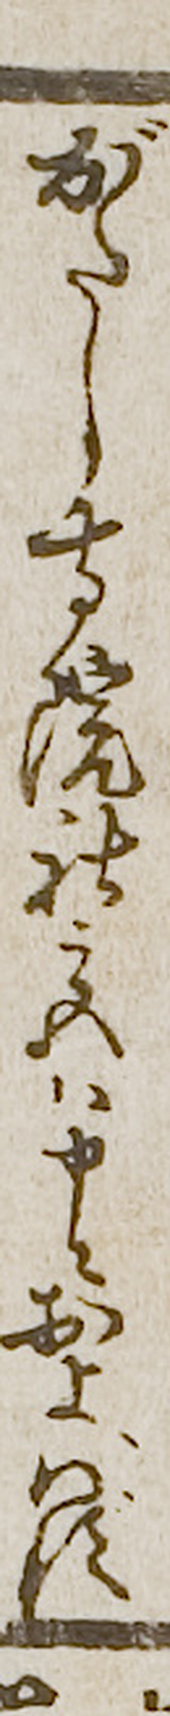がたし寺院社宮は申におよはす
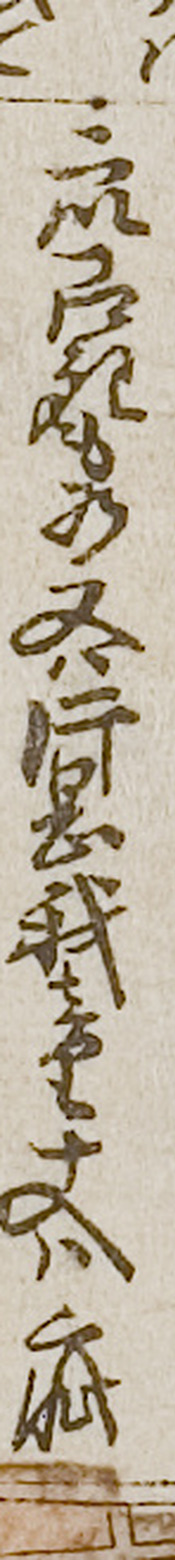衆即死も有又は片岡我童丈は疵
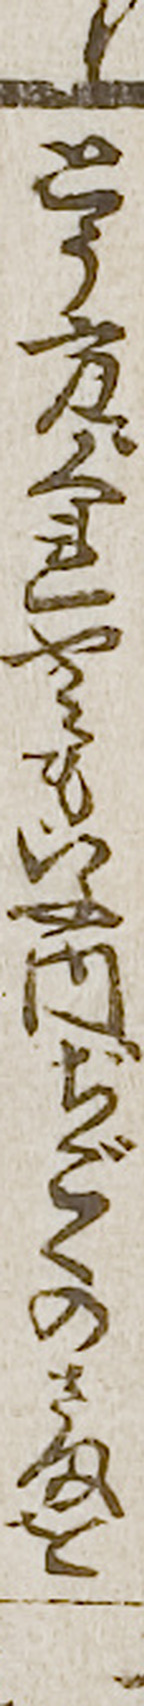とう方にくれやゝもいふ内ぢごくのさまを
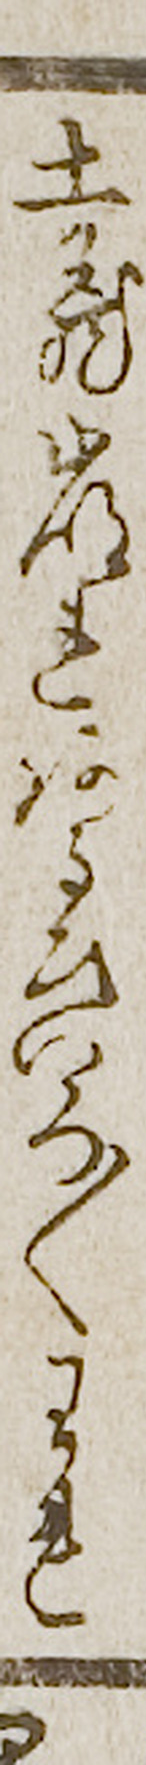土蔵崩れあるはいろ〳〵われ
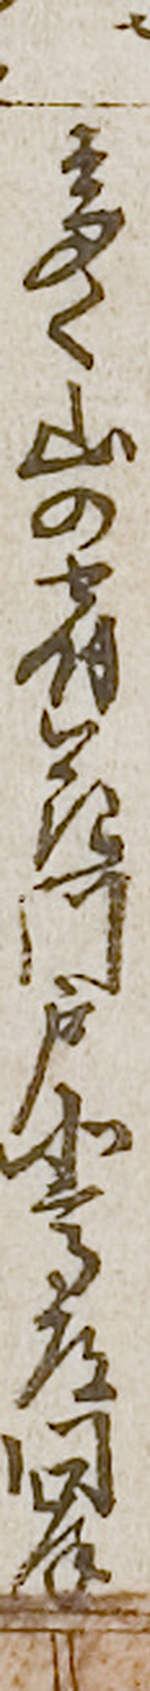多く山の宿花川戸北馬道川岸
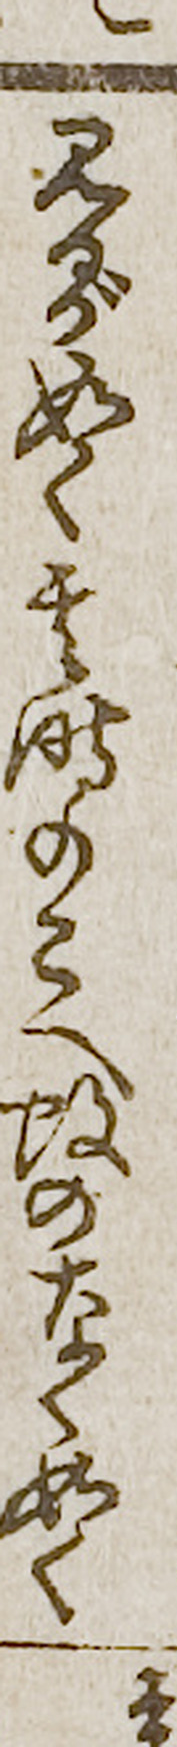見るが如く其時のこへ蚊のなく如く
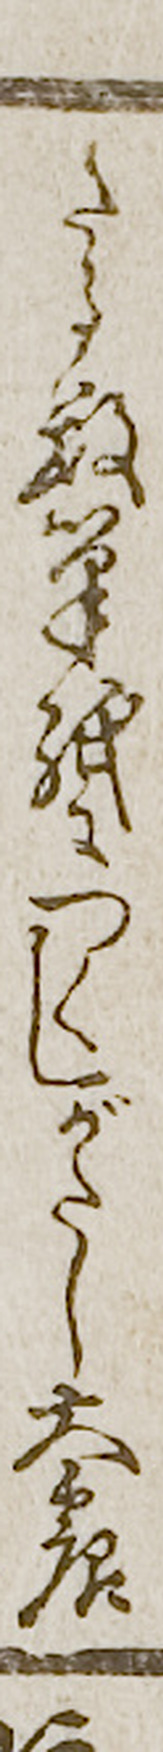たる数筆紙につくしがたし大震
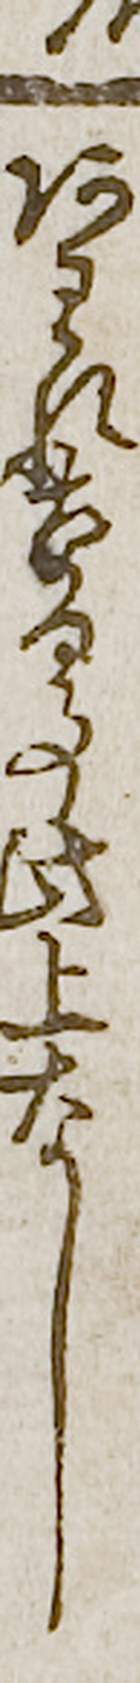あわれなる事此上なし
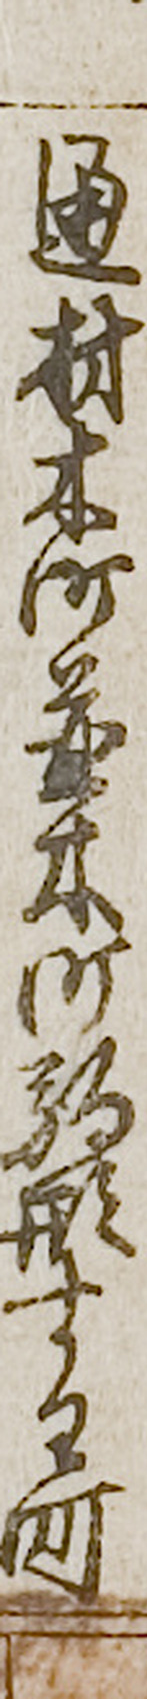通材木町並木町駒形すわ町
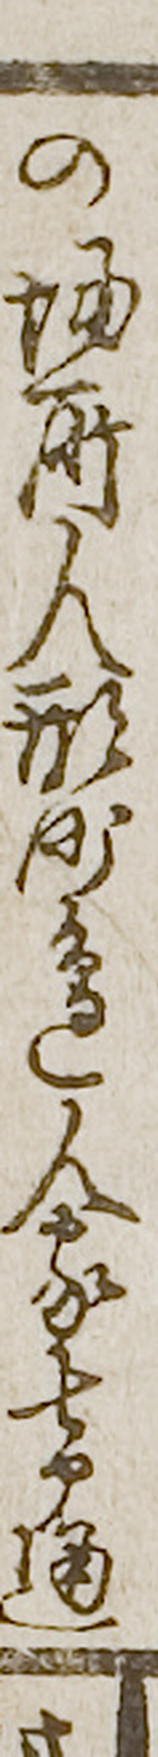の場所人形町辺人家七部通
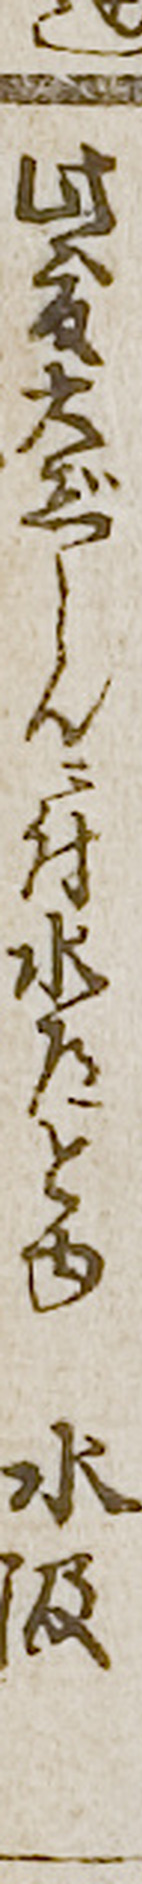此度大じしんに付水道とゆ
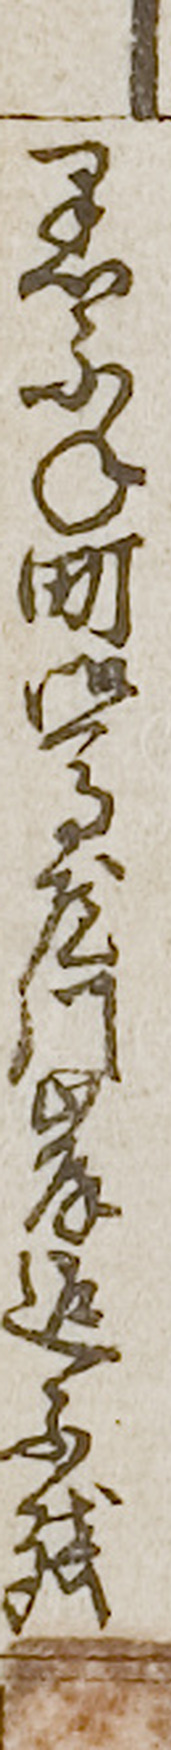黒ふね町御馬屋川岸迠不残
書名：東都珍事実録咄
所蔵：東京大学総合図書館 General Library in the University of Tokyo, JAPAN
